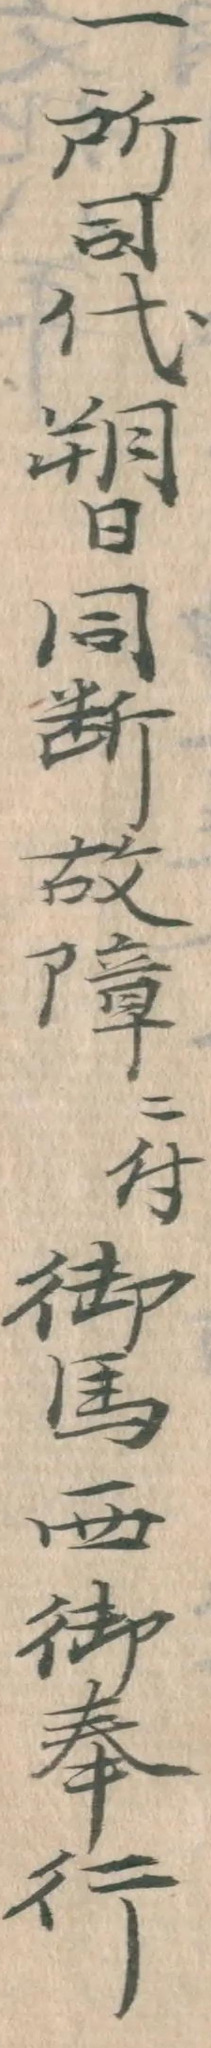一所司代朔日同断故障ニ付御馬西御奉行
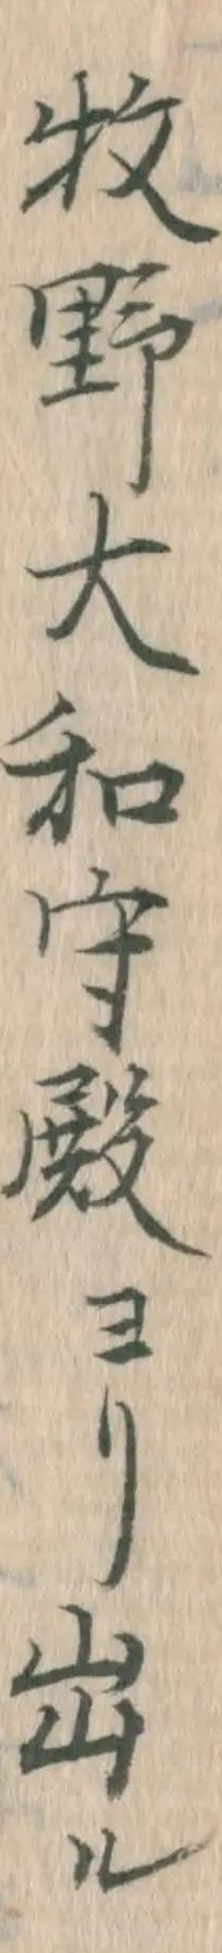牧野大和守殿ヨリ出ル
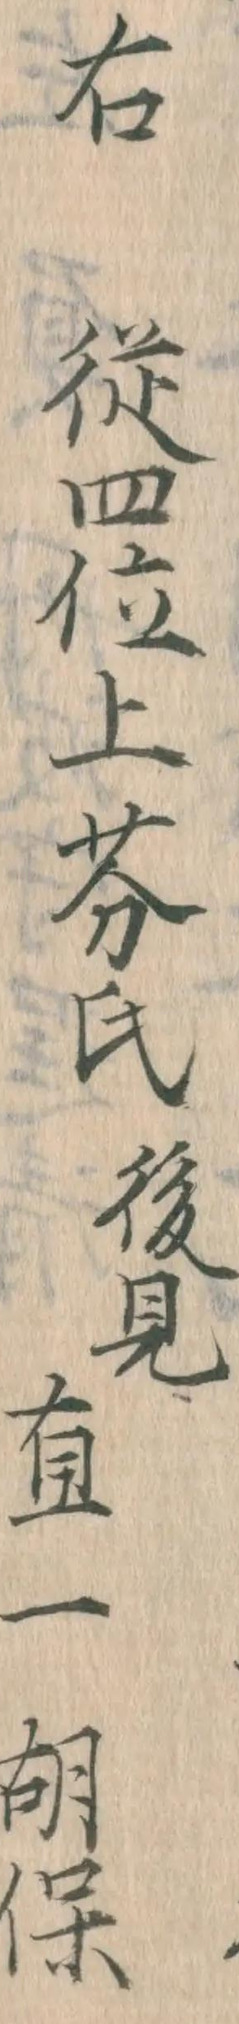右従四位上芬氏後見直一胡保
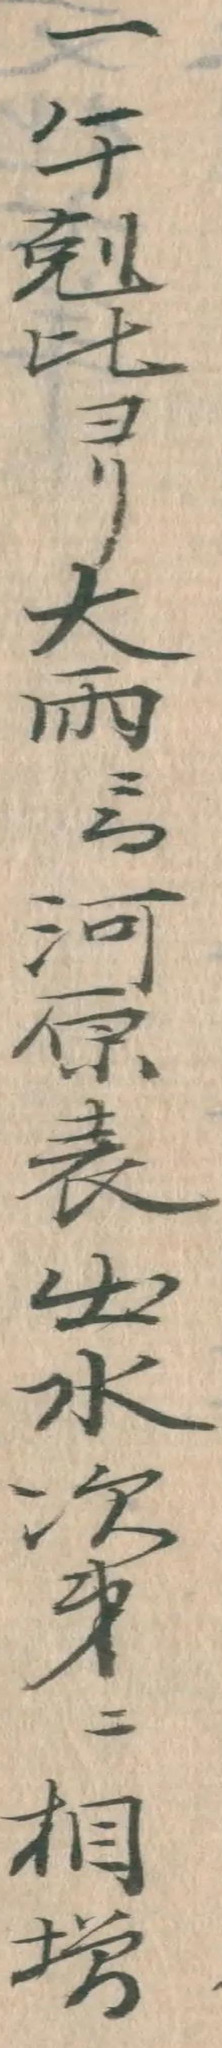一午尅比ヨリ大雨ニ而河原表出水次第ニ相増
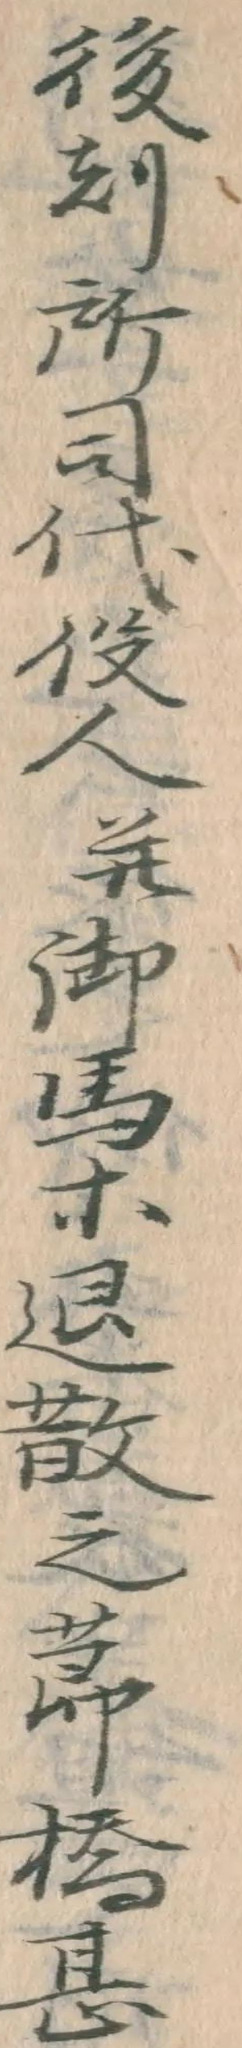後刻所司代役人并御馬等退散之節橋甚
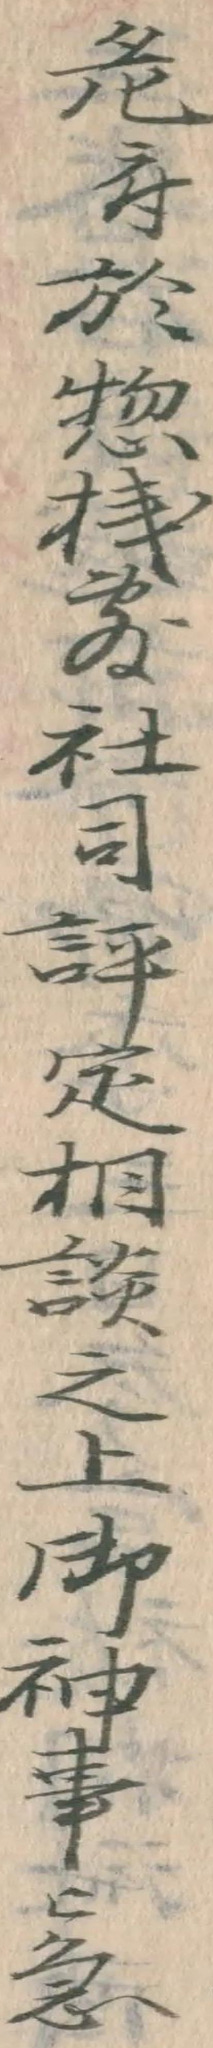危ニ付於惣桟敷社司評定相談之上御神事被急
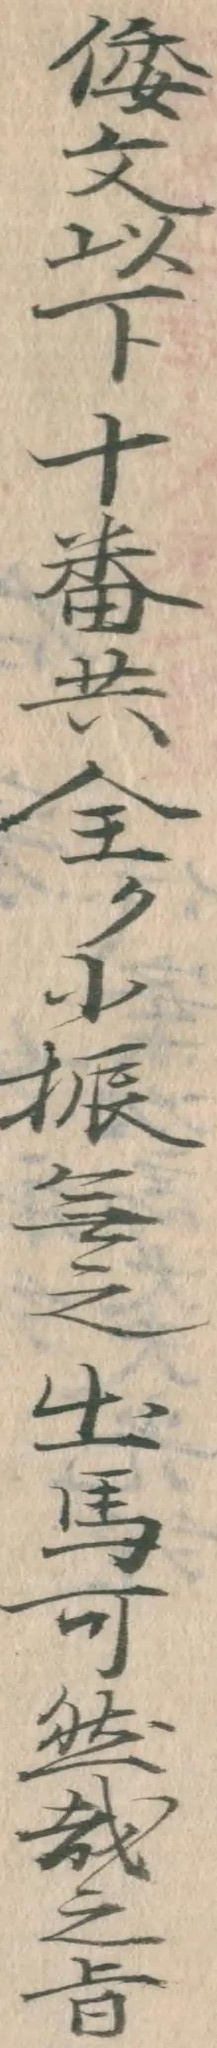倭文以下十番共全ク小振無之出馬可然哉之旨
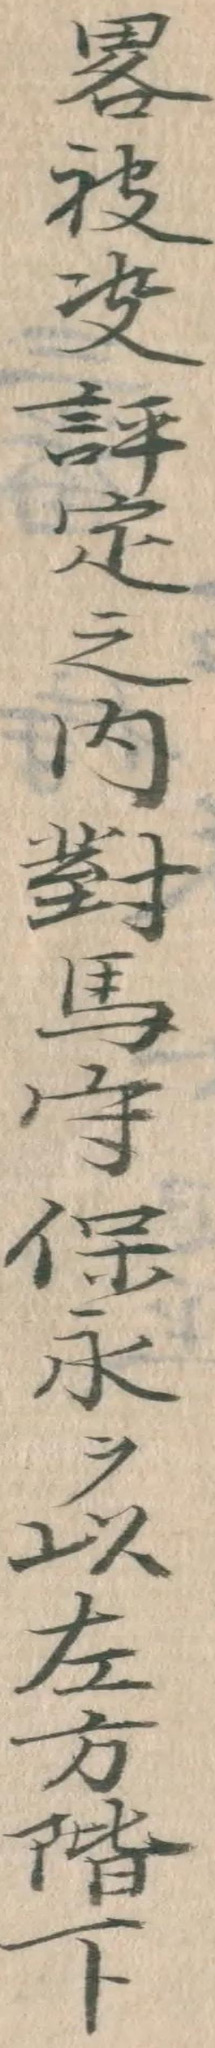略被決評定之内対馬守保永ヲ以左方階下
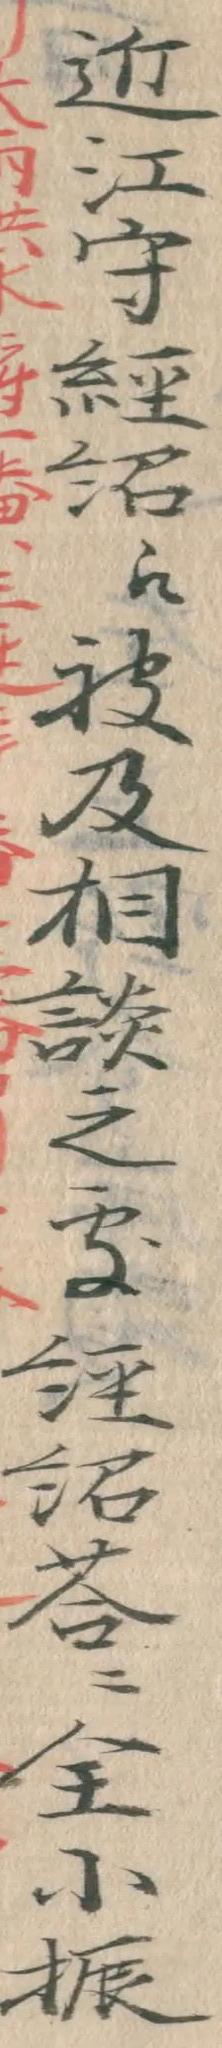近江守経紹江被及相談之処経紹答ニ全小振
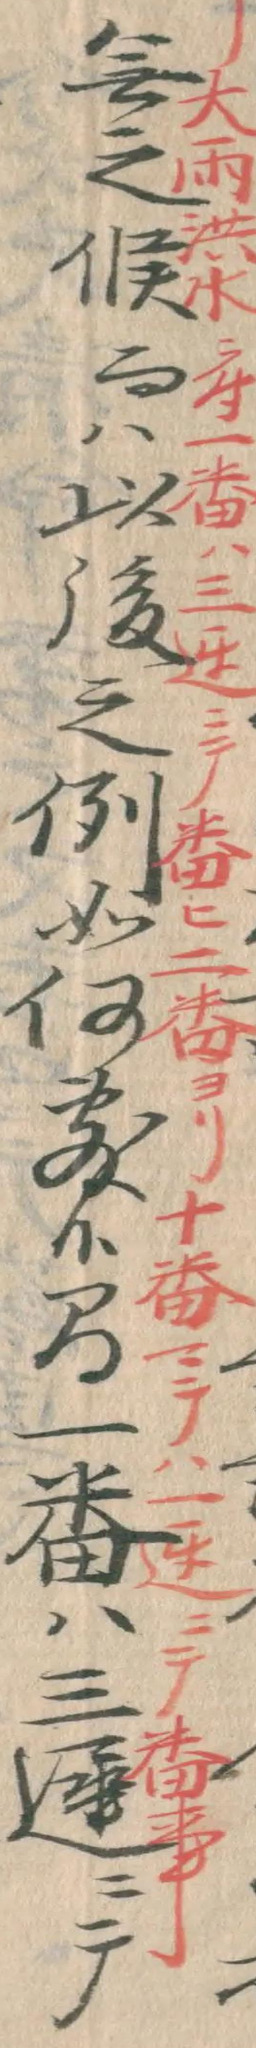無之候而ハ以後之例如何敷候間一番ハ三遅ニテ
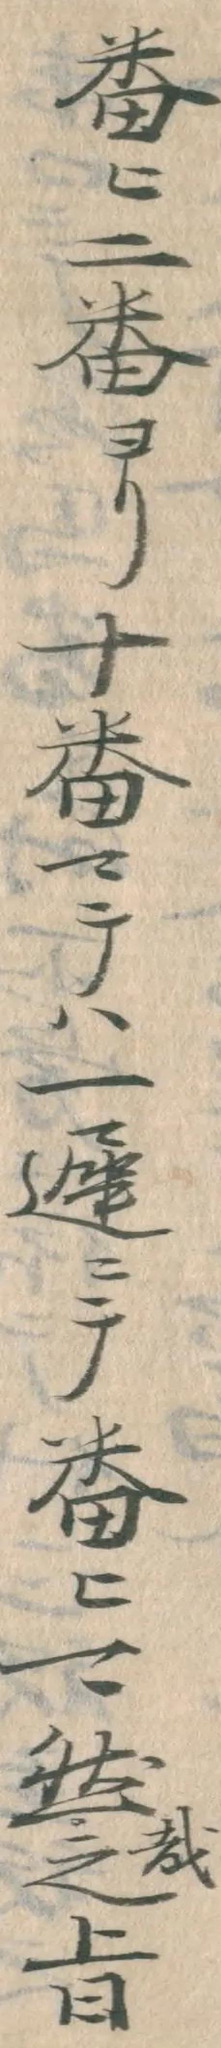番被二番ヨリ十番マテハ一遅ニテ番被可然之旨
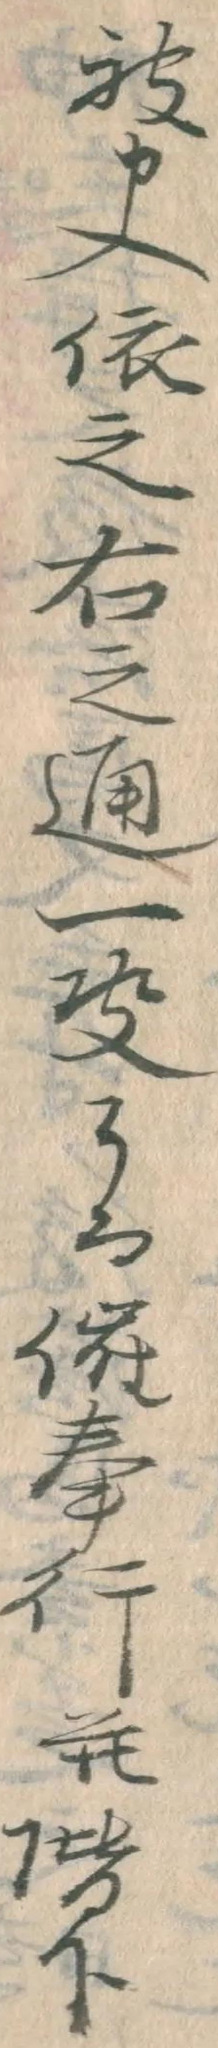被申入依之右之通一決ニ而催奉行并階下
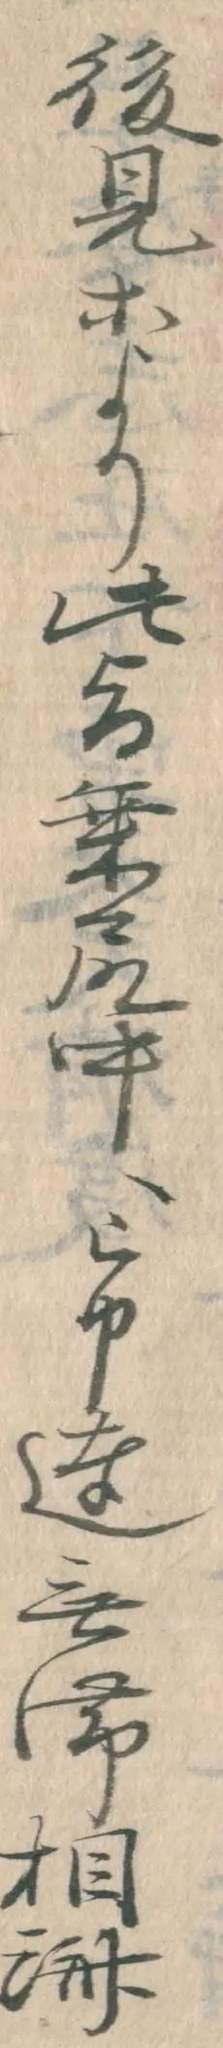後見等より此旨乗尻中ヘ被申達無滞相済
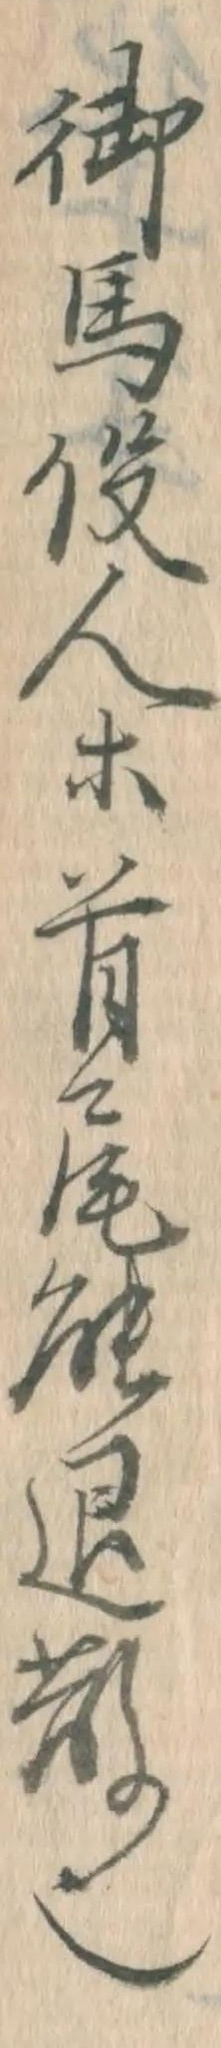御馬役人等首尾能退散也

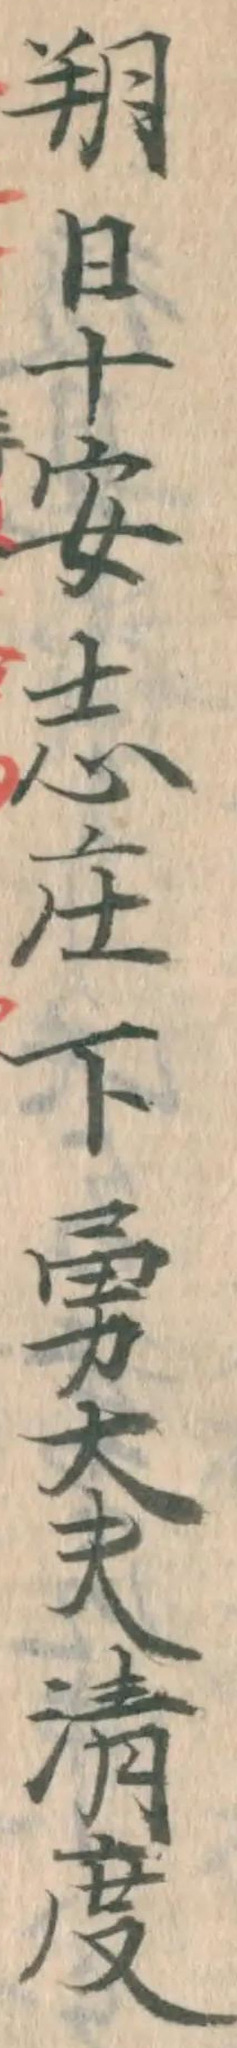朔日十安志庄下勇大夫清度
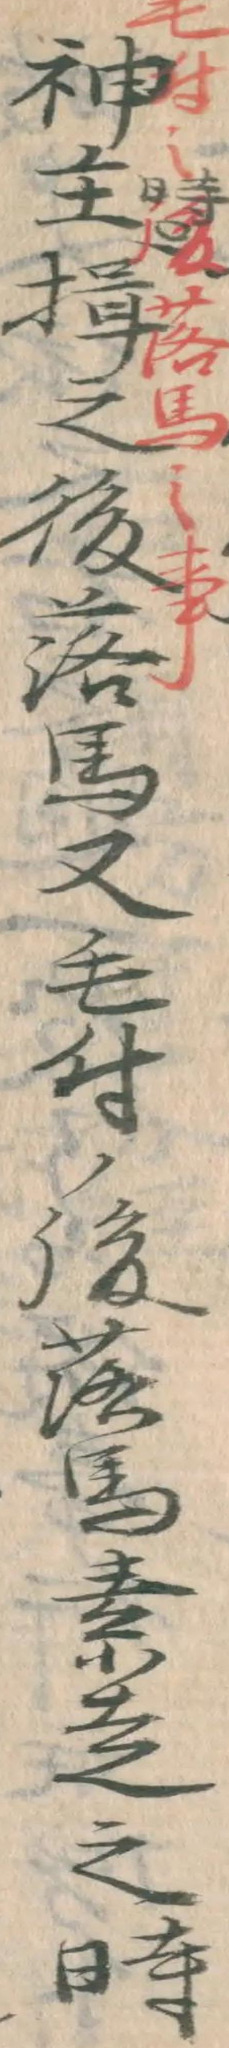神主揖之後落馬又毛付ノ後落馬素走之時
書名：賀茂社記録. 第10冊
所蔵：国立国会図書館 National Diet Library, JAPAN
